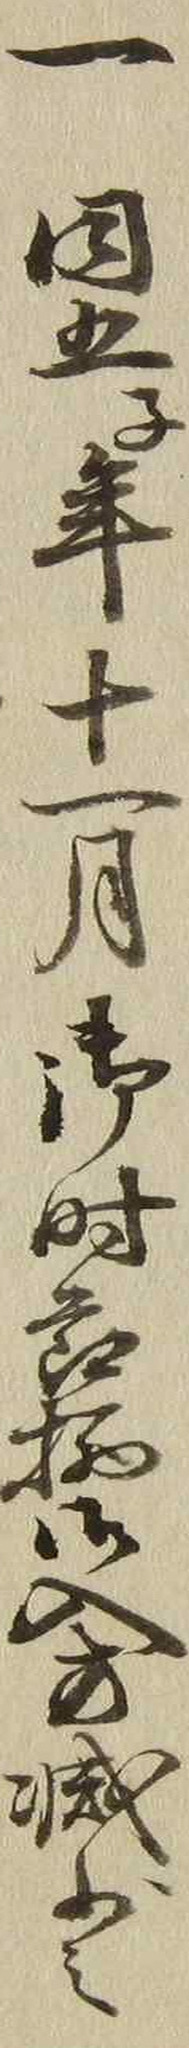一同五子年十一月御時節柄御入方減少之
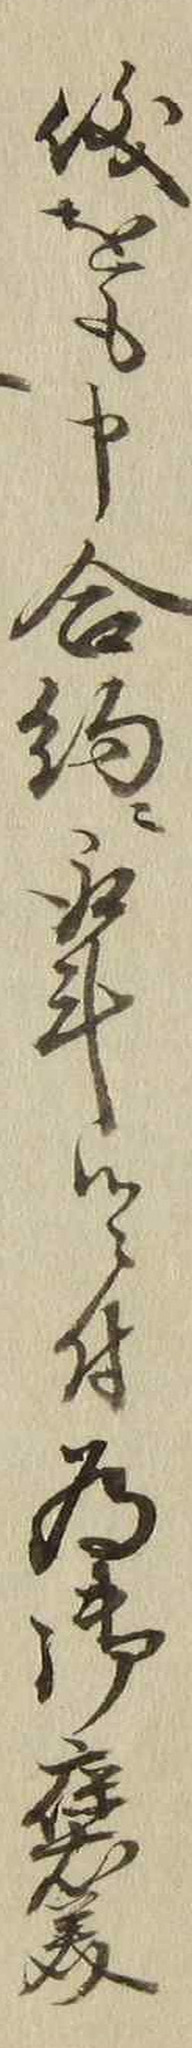儀をも申合約ニ取斗候ニ付為御褒美
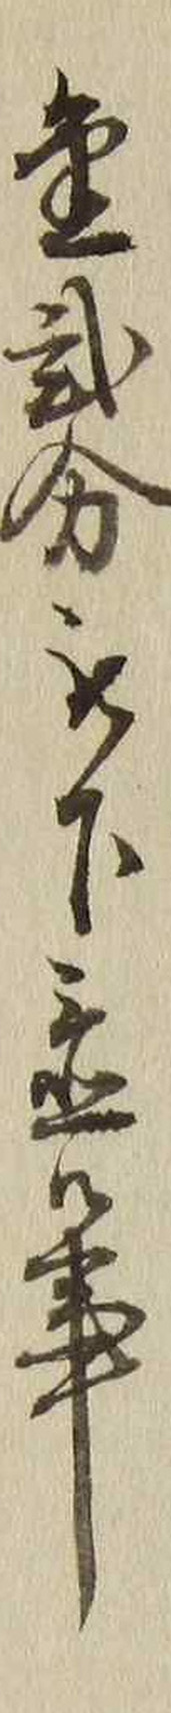金弐分被下置候事
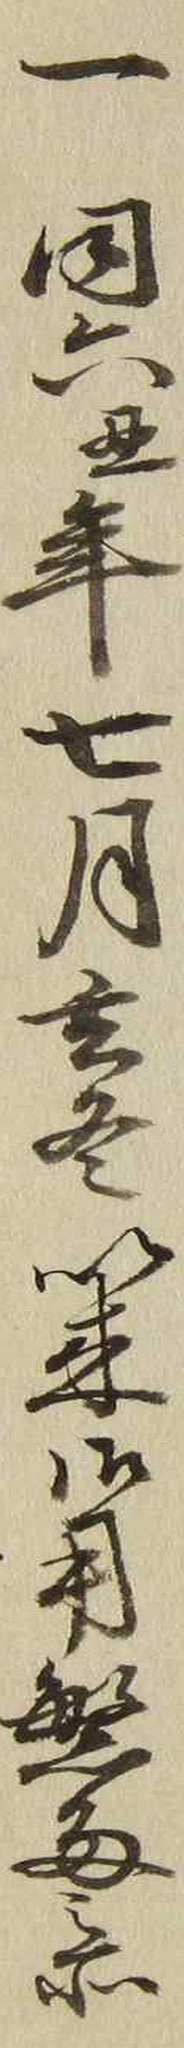一同六丑年七月玄冬以来御用繫多之所
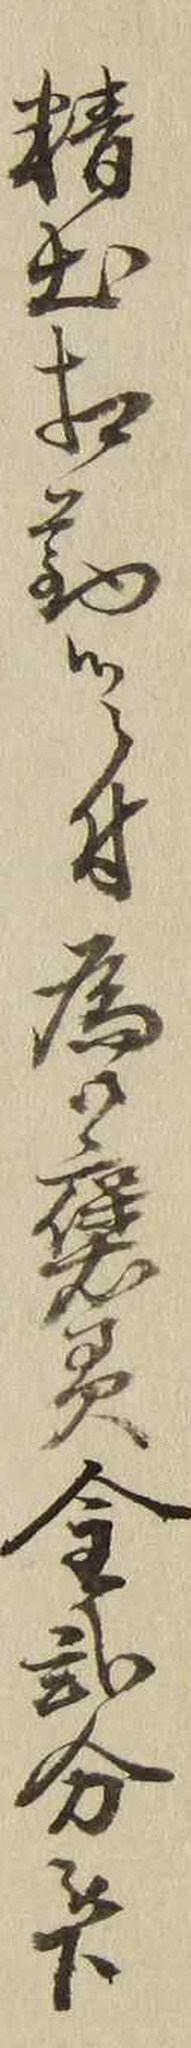精出相勤候ニ付為御褒美金弐分被下
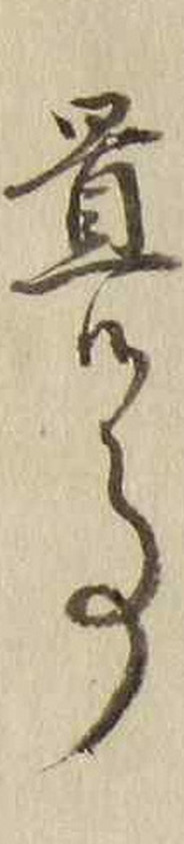置候事

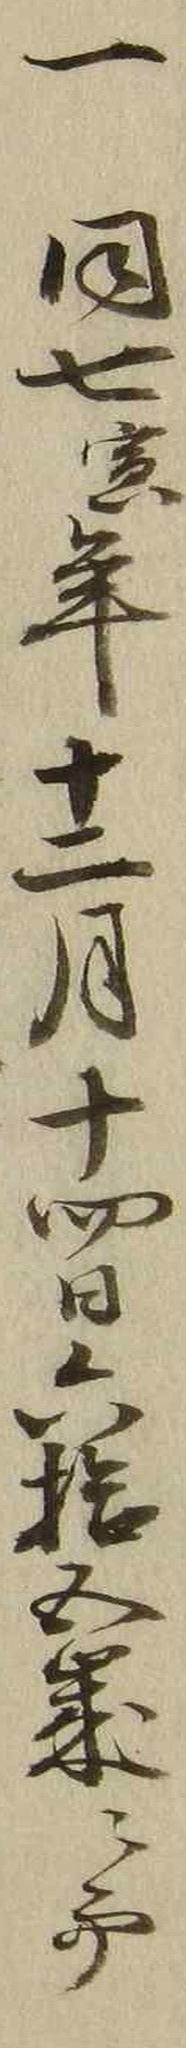一同七寅年十二月十四日六拾五歳ニ而
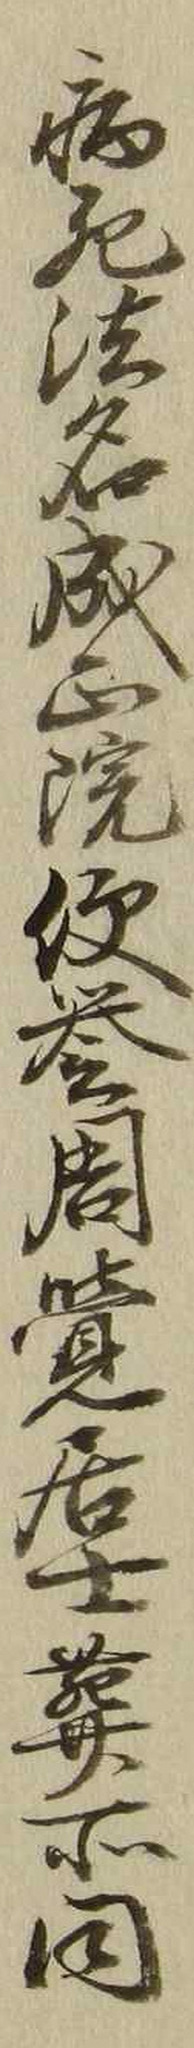病死法名成正院便誉周覚居士葬所同
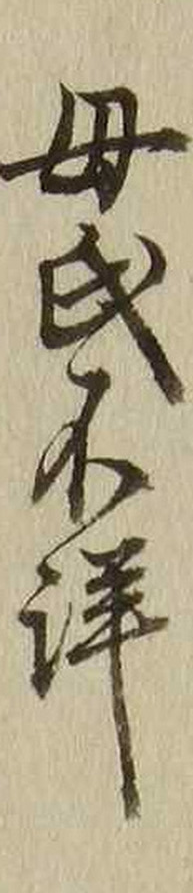母氏不詳
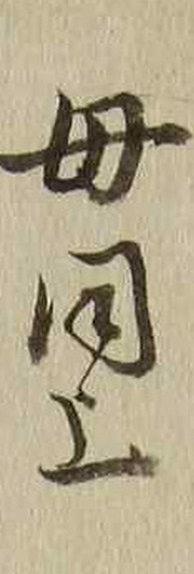母同上
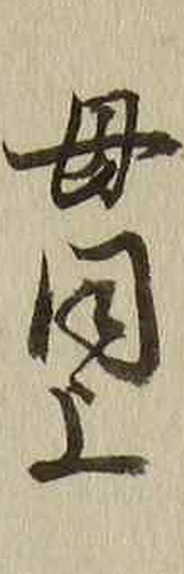母同上
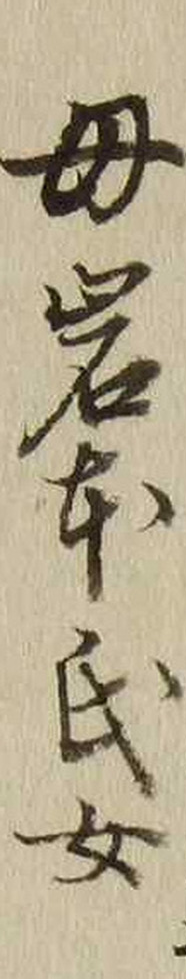母岩本氏女
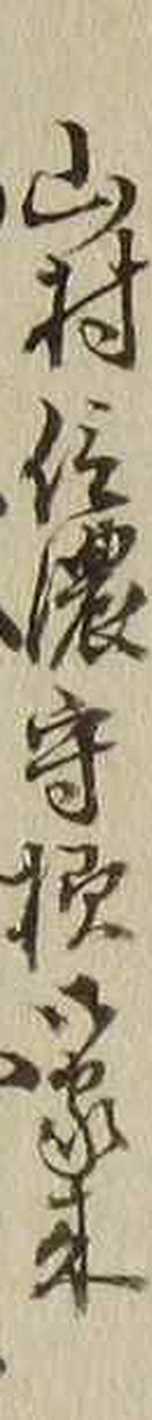山村信濃守様御家来
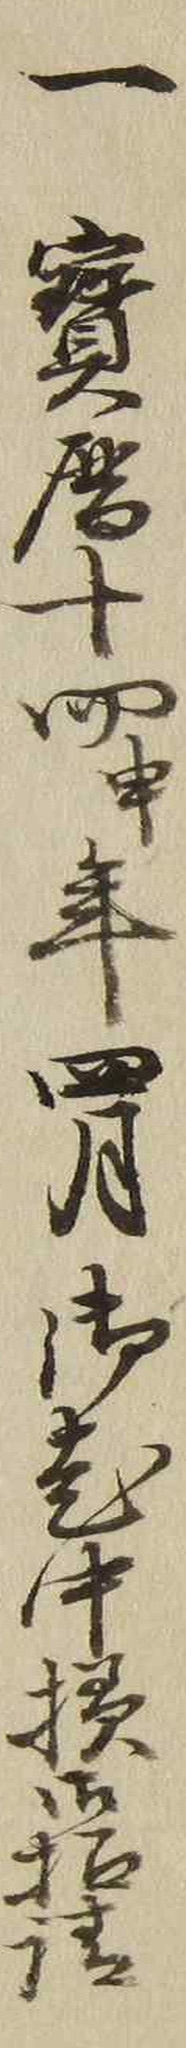一宝暦十四申年四月御老中様御招請
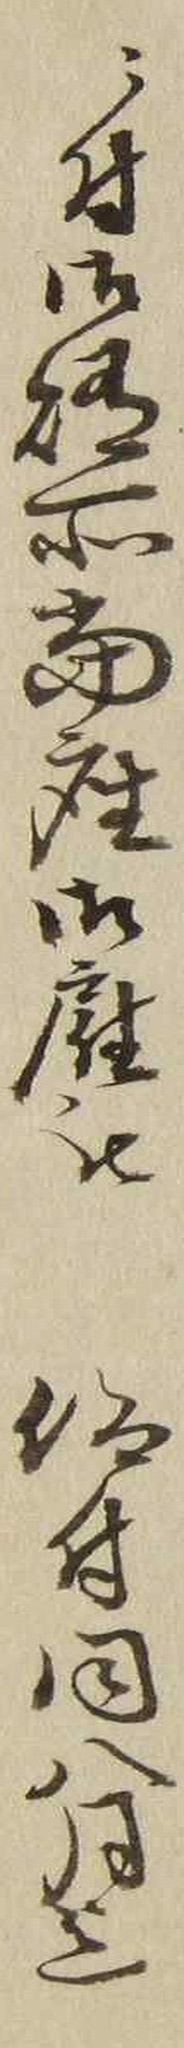ニ付御賄所当座御雇被仰付同八月迄

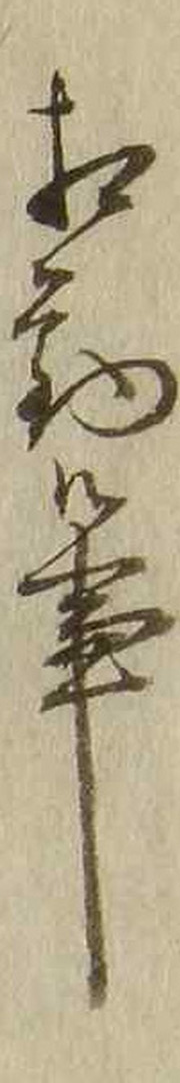相勤候事
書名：諸士系譜　巻之64　と之部7
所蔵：会津若松市立会津図書館
